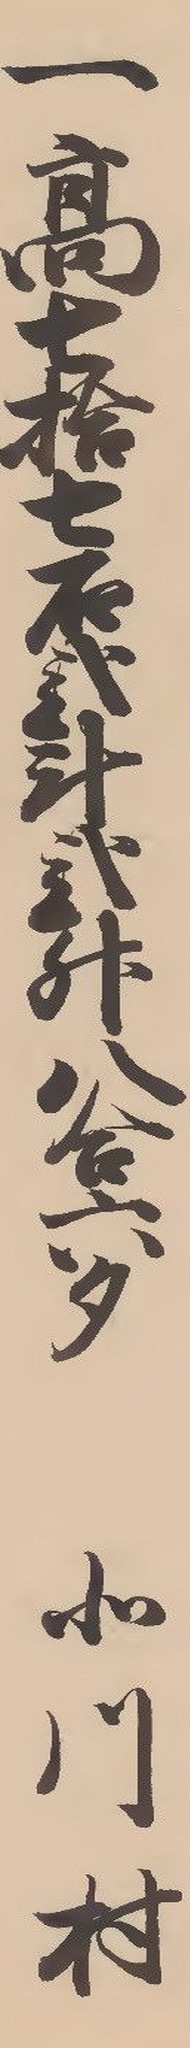一高七拾七石弐斗弐升八合六勺北川村
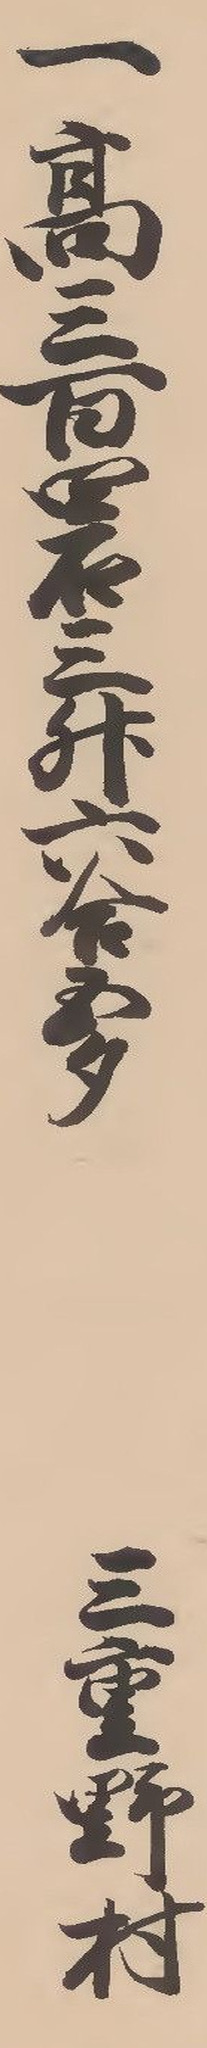一高三百四石三升六合五勺三重野村
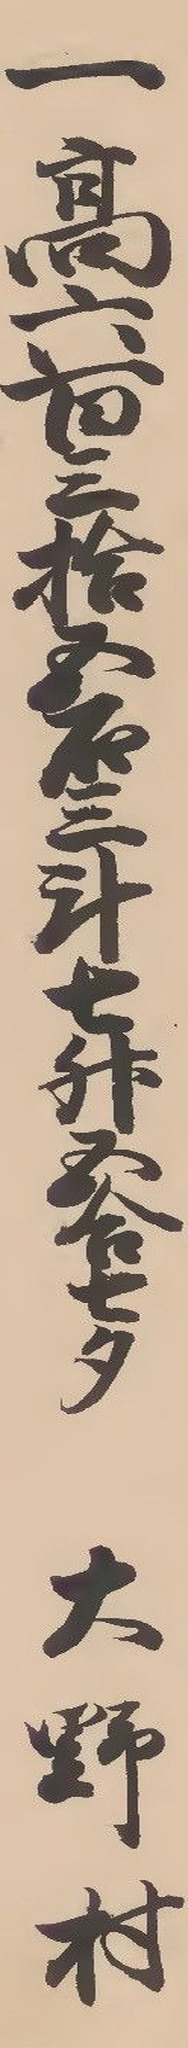一高六百三拾五石三斗七升五合七勺大野村

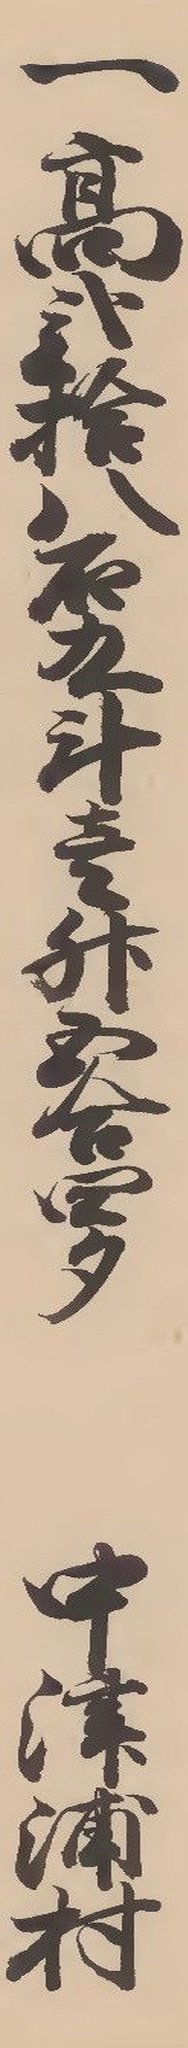一高弐拾八石九斗壱升五合四勺中津浦村
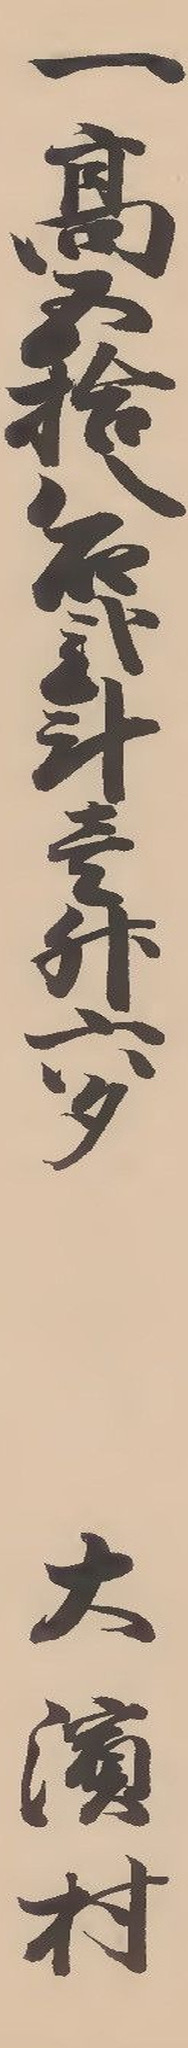一高五拾八石弐斗壱升六勺大浜村
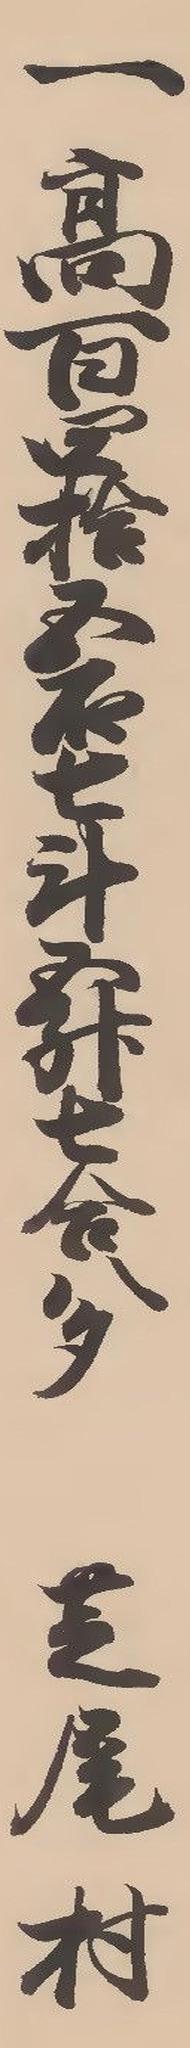一高百四拾五石七斗五升七合八勺芝尾村
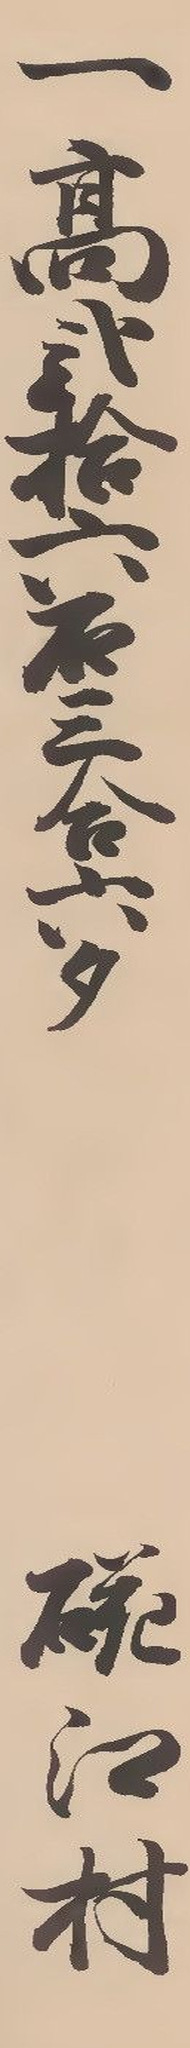一高弐拾六石三合六勺硴江村
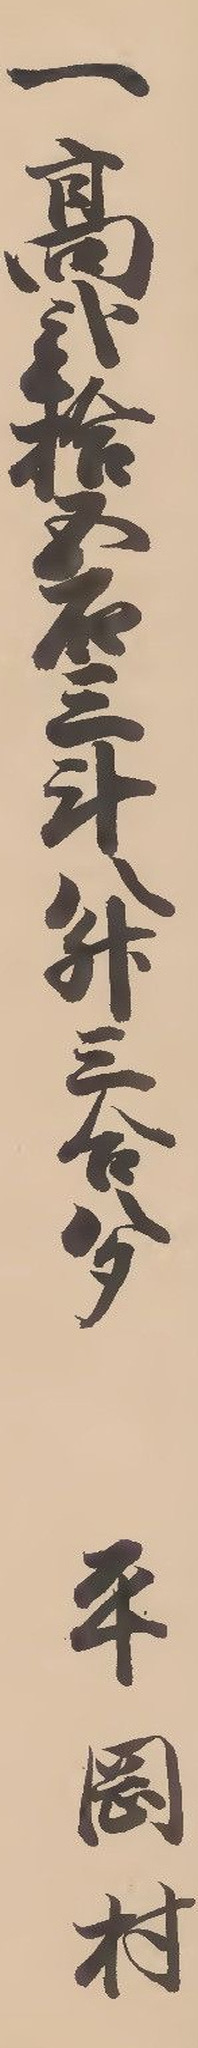一高弐拾五石三斗八升三合八勺平岡村
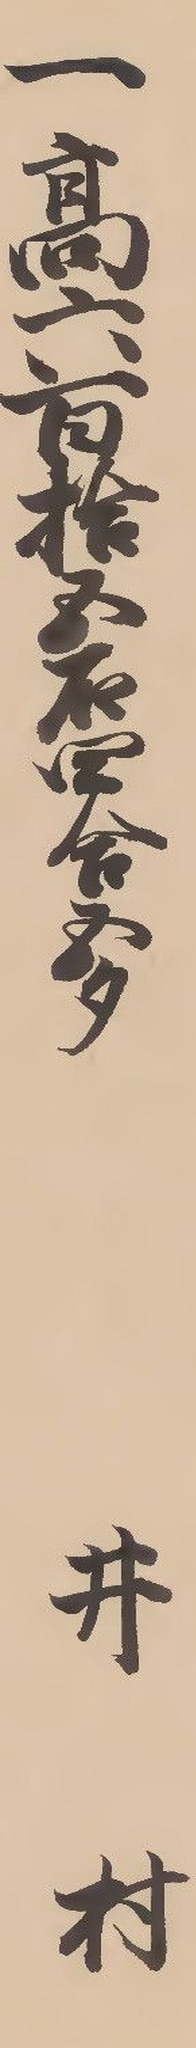一高六百拾五石四合五勺井村
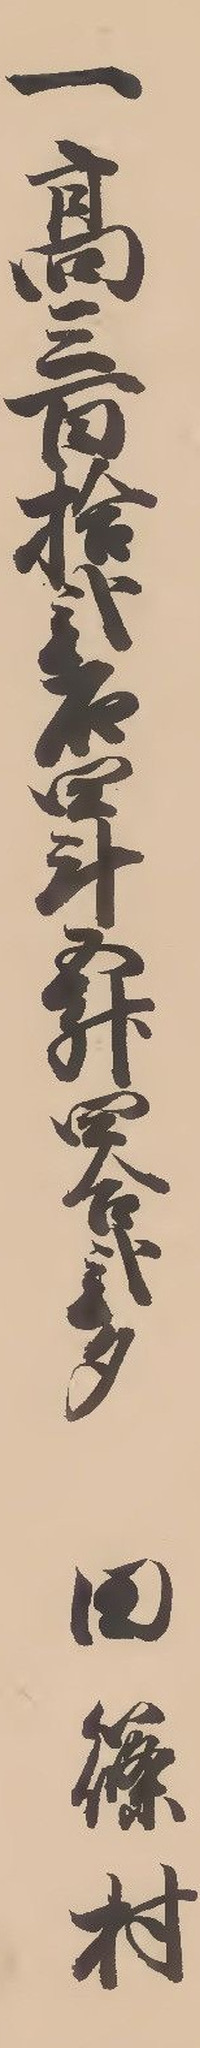一高三百拾弐石四斗五升四合弐勺田篠村
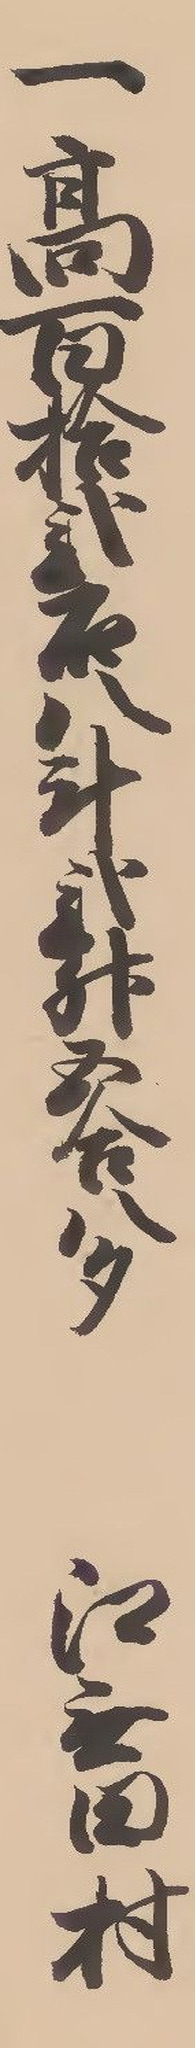一高百拾弐石八斗弐升五合八勺江無田村

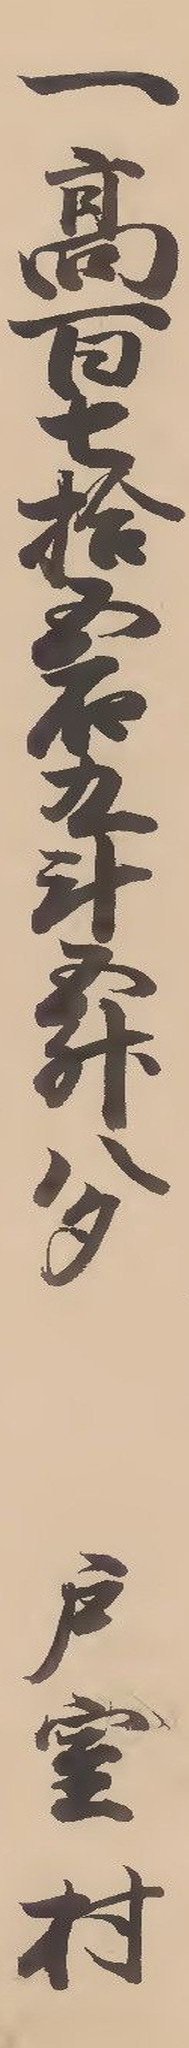一高百七拾五石九斗五升八勺戸室村
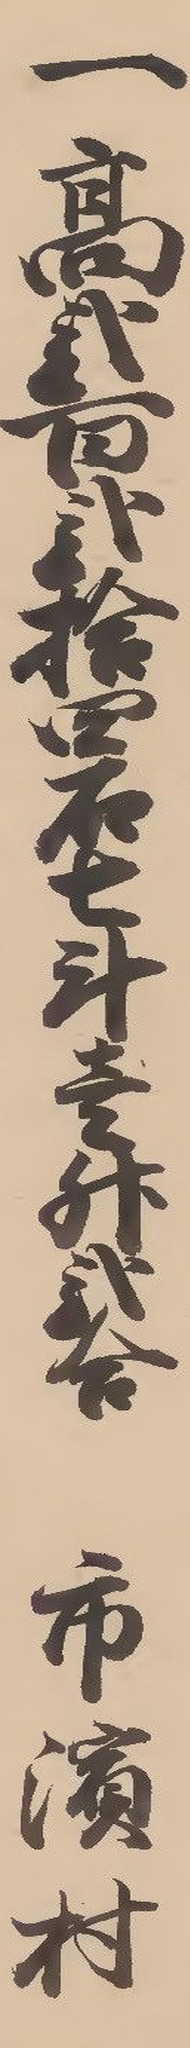一高弐百弐拾四石七斗壱升弐合市浜村
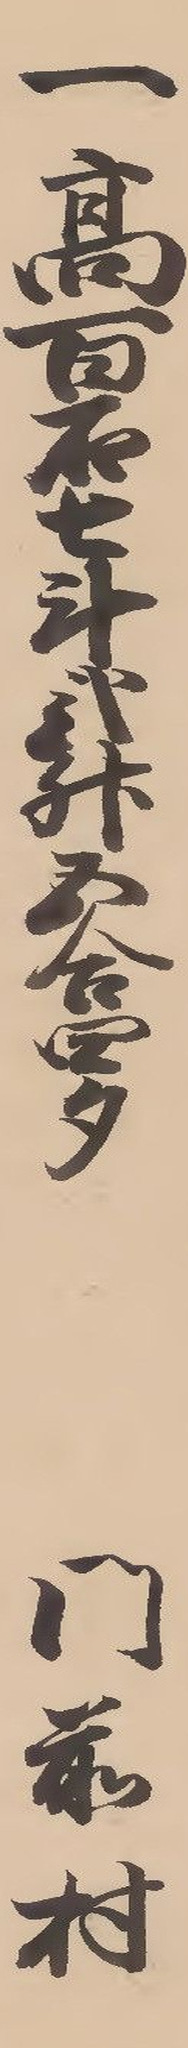一高百石七斗弐升五合四勺門前村
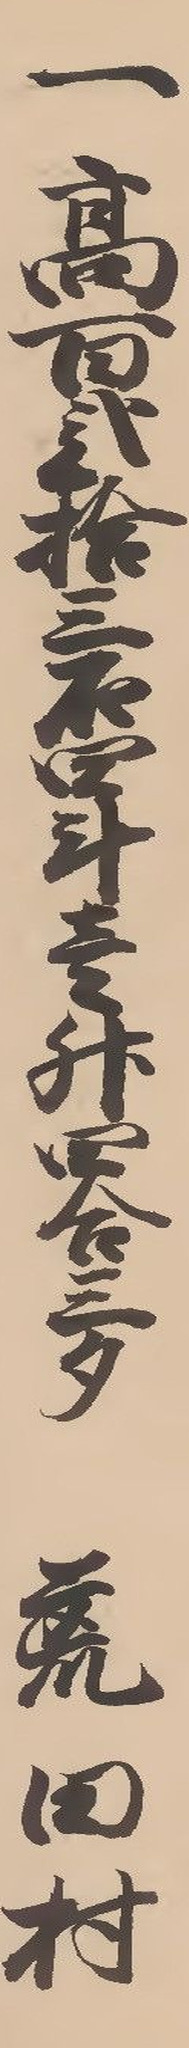一高百弐拾三石四斗壱升四合三勺荒田村
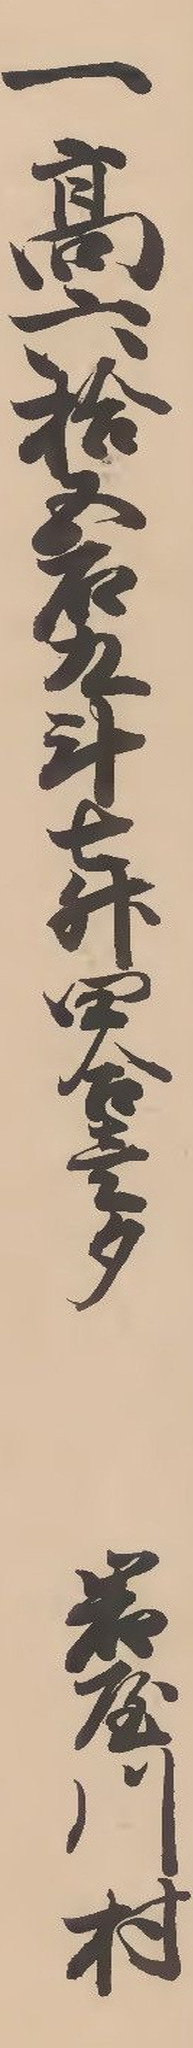一高六拾五石九斗七升四合壱勺岩屋川村
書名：豊後国郷帳
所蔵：国立公文書館 National Archives of Japan
